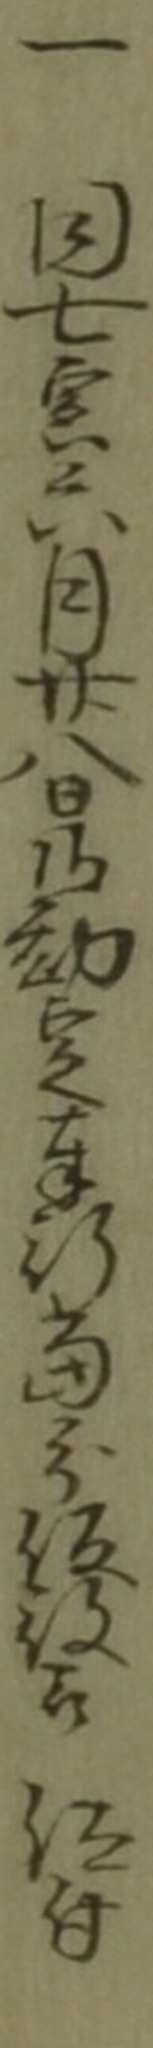一同七寅六月廿八御勘定奉行当分仮役被仰付
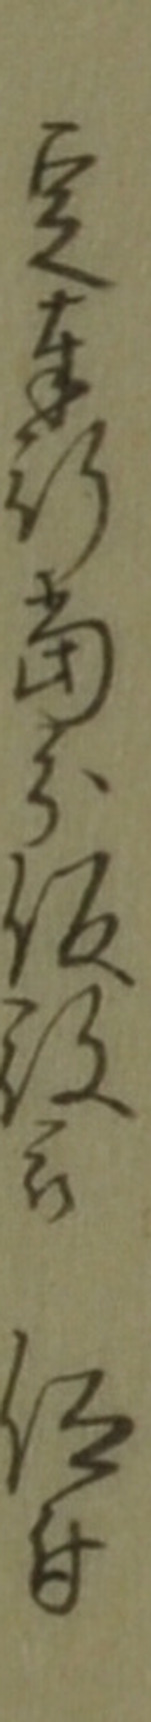定奉行当分仮役被仰付
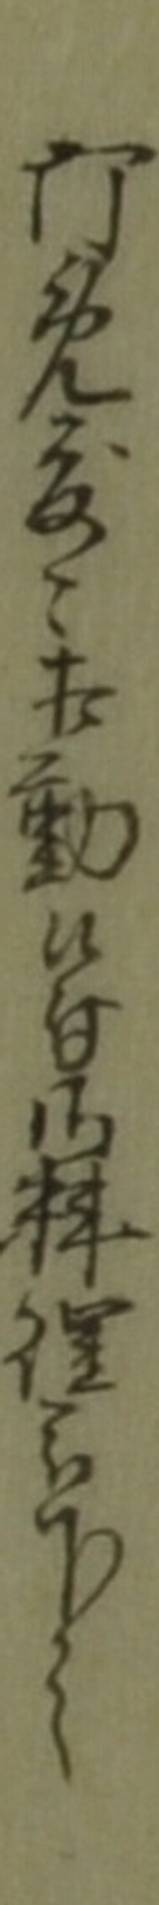御免度々相勤候付御料理被下之

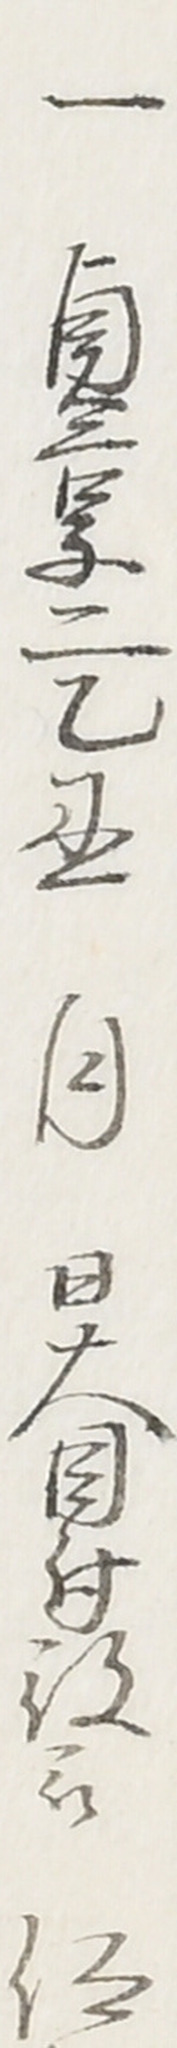一貞享二乙丑月日大目付役被仰付
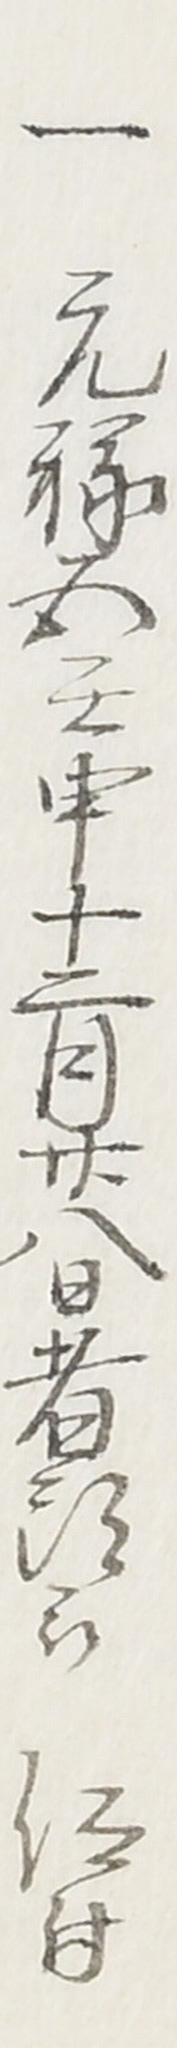一元禄五壬申十二月廿八日者頭被仰付
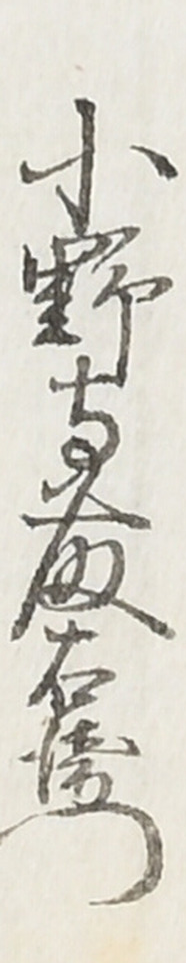小野寺藤右衛門
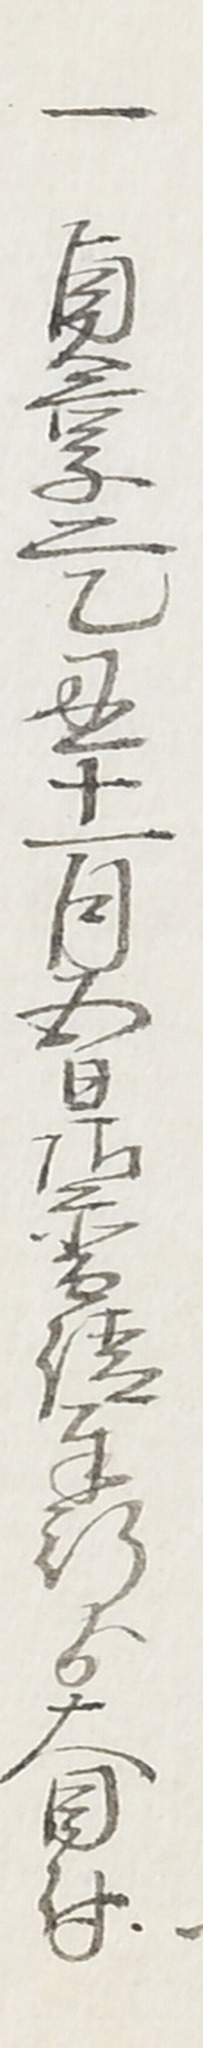一貞享二乙丑十一月五日御普請奉行ゟ大目付
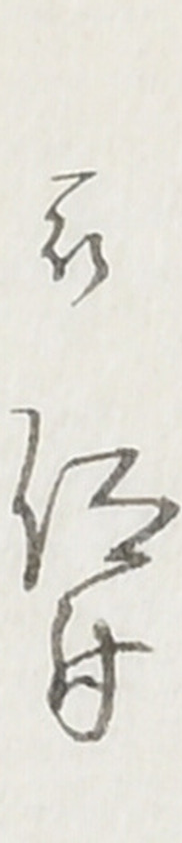被仰付
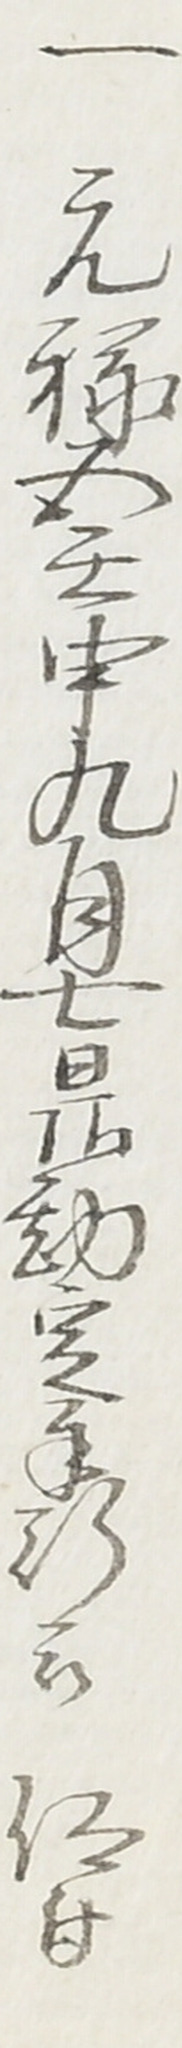一元禄五壬申九月七日御勘定奉行被仰付
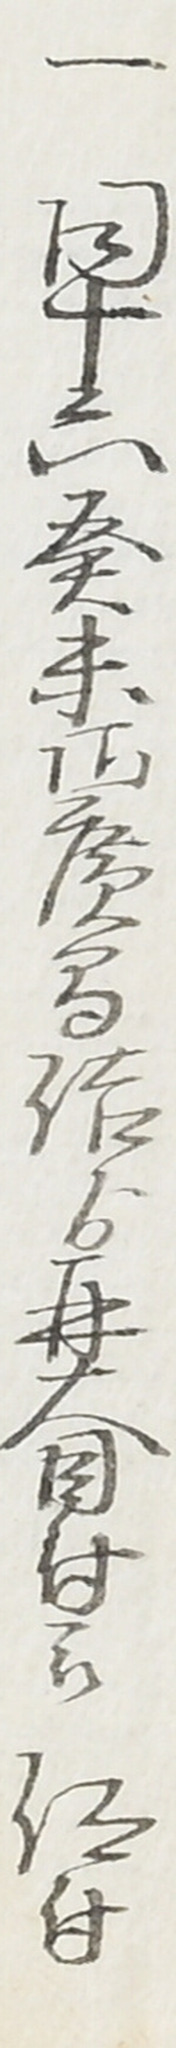一同十六癸未御広間詰ゟ再大目付被仰付
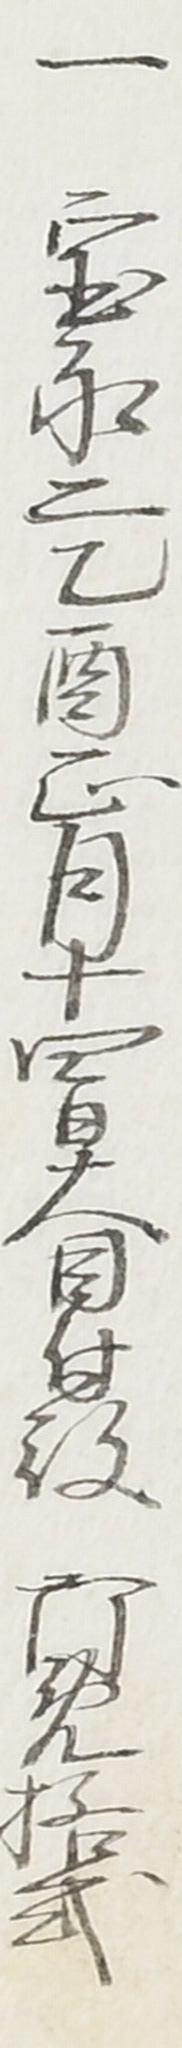一宝永二乙酉正月十四日大目付役御免格式
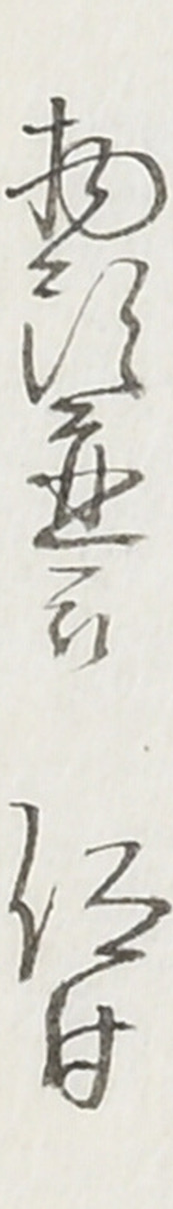物頭並被仰付
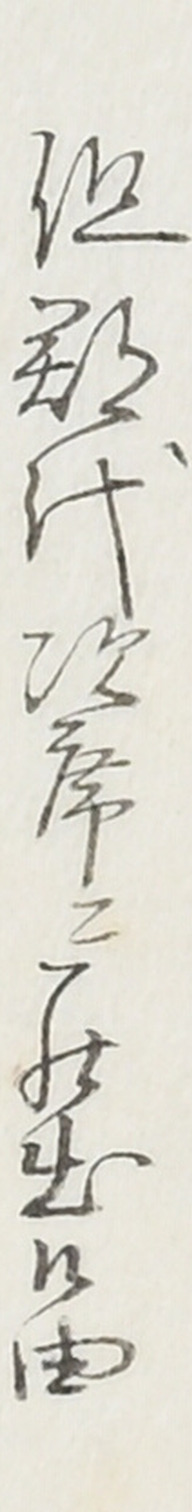但郡代次席ニ罷出候由

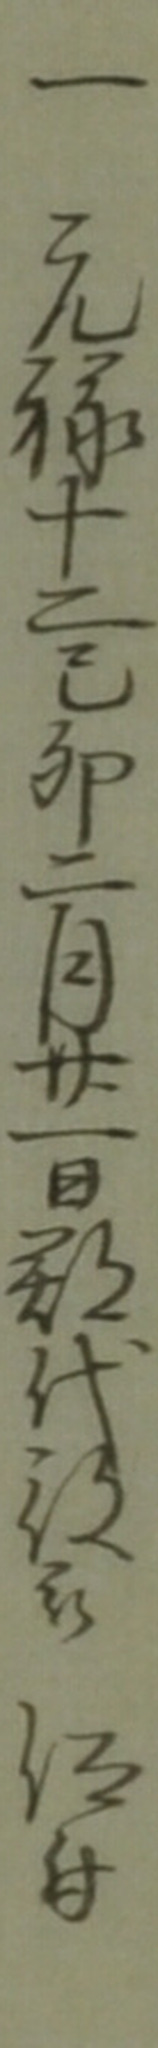一元禄十二己卯二月廿一日郡代役被仰付
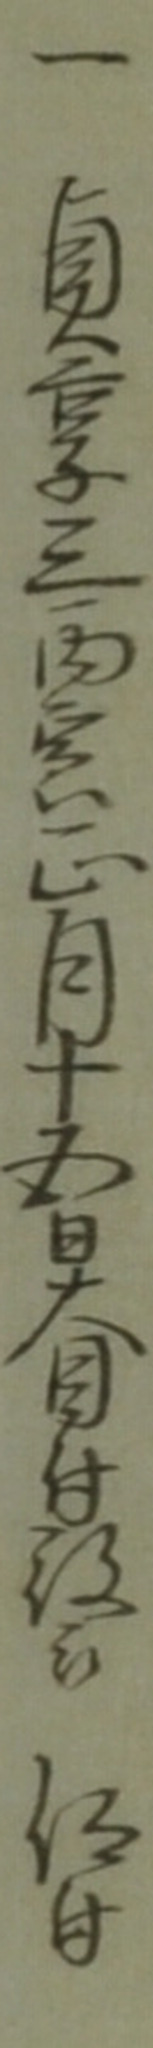一貞享三丙寅正月十五日大目付役被仰付
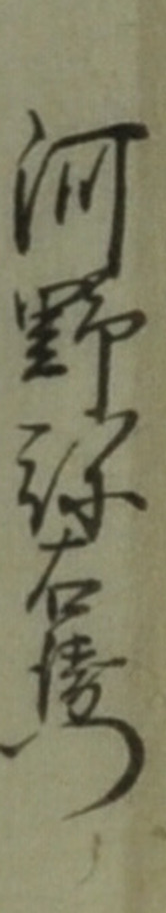河野弥右衛門
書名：諸御役代々録（三）
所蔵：伊那市立高遠町図書館・合同会社AMANE
